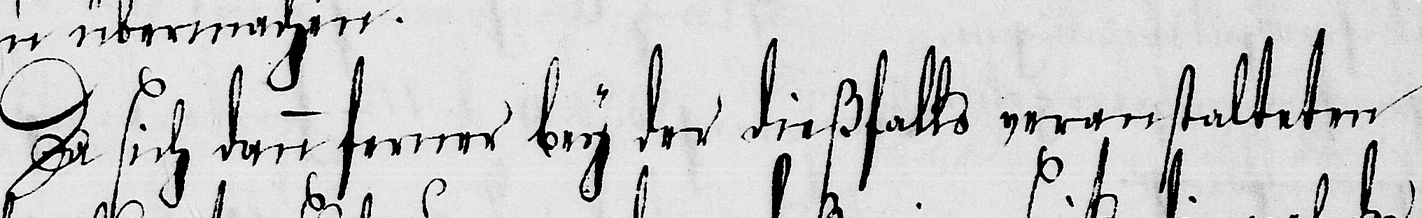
Da sich dann ferner bey der dießfalls veranstalteten
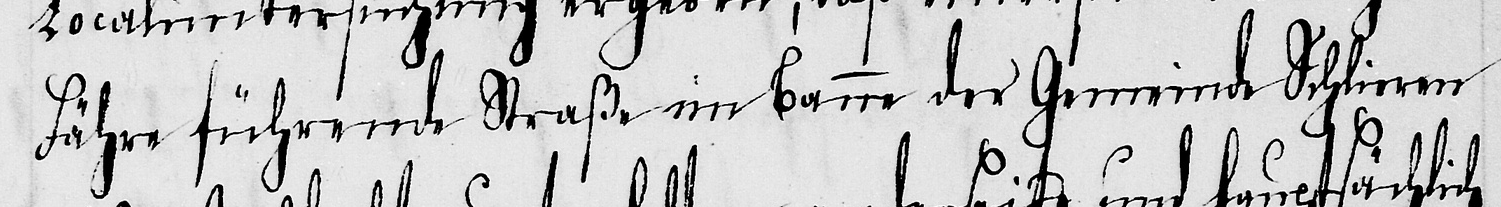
Fähre führende Straße im Banne der Gemeinde Schlieren
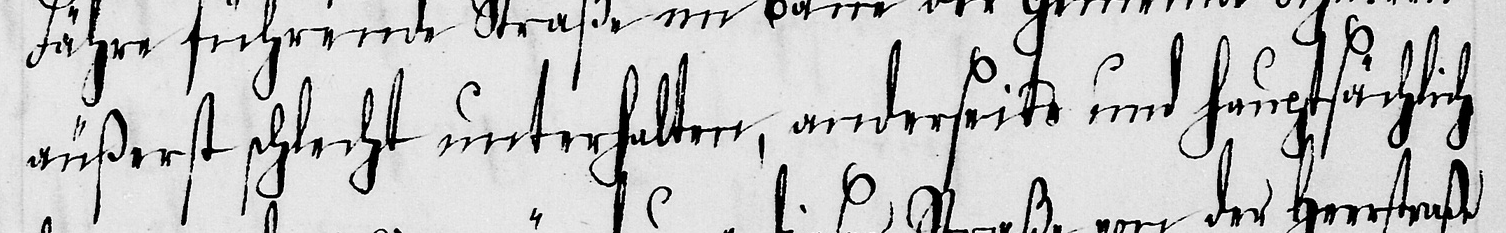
äußerst schlecht unterhalten, anderseits und hauptsächlich
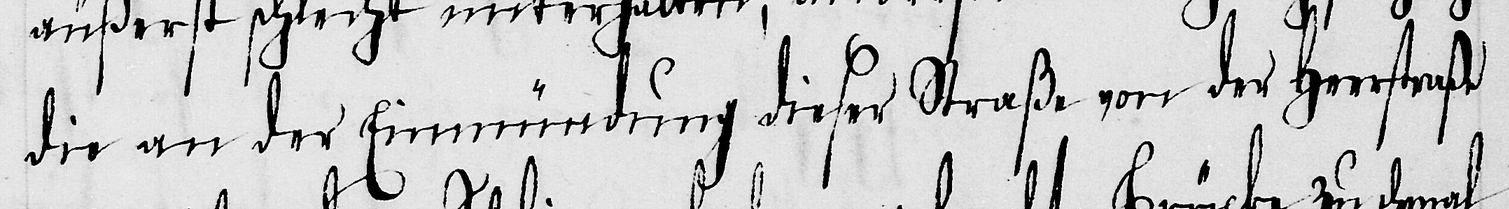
die an der Einmündung dieser Straße von der Heerstraße
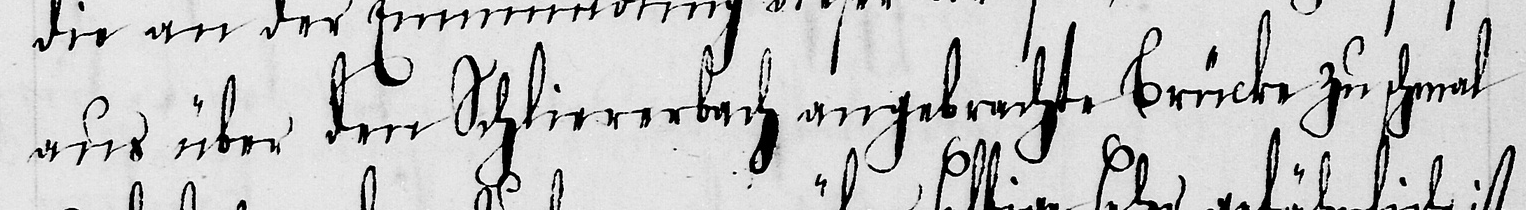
aus über den Schliererbach angebrachte Brücke zu schmal
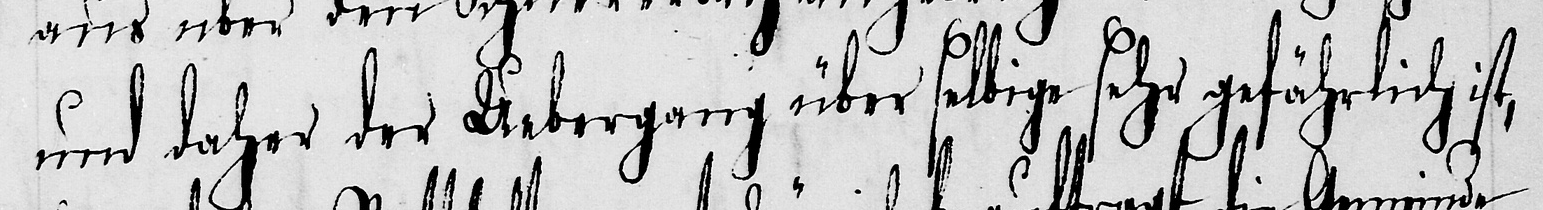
und daher der Uebergang über selbige sehr gefährlich
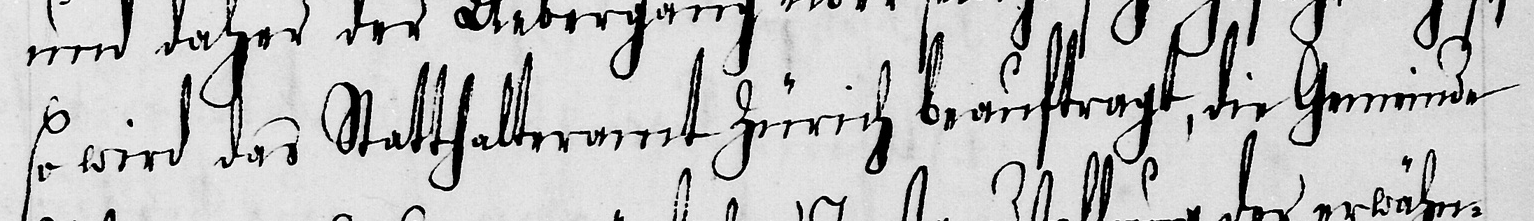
so wird das Statthalteramt Zürich beauftragt, die Gemeinde
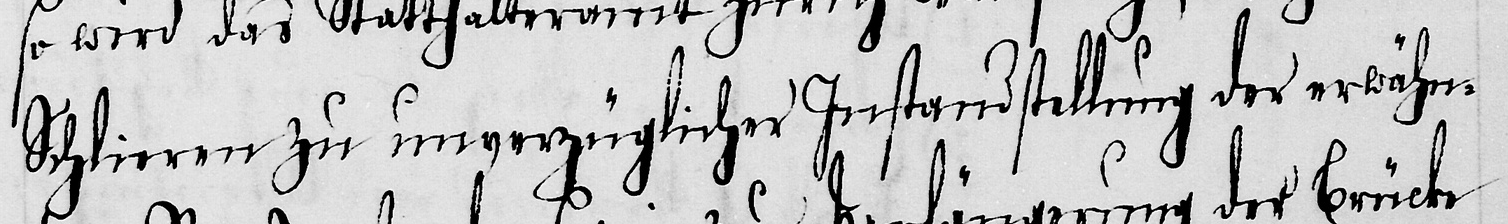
Schlieren zu unverzüglicher Instandstellung der erwähn¬
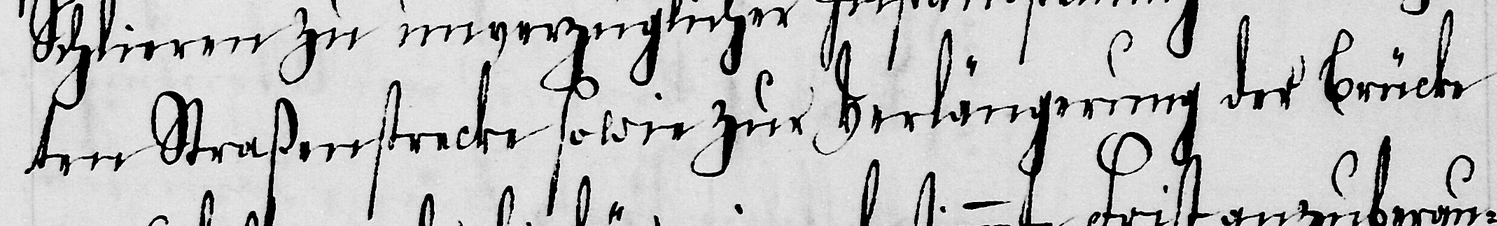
ten Straßenstrecke sowie zur Verlängerung der Brücke
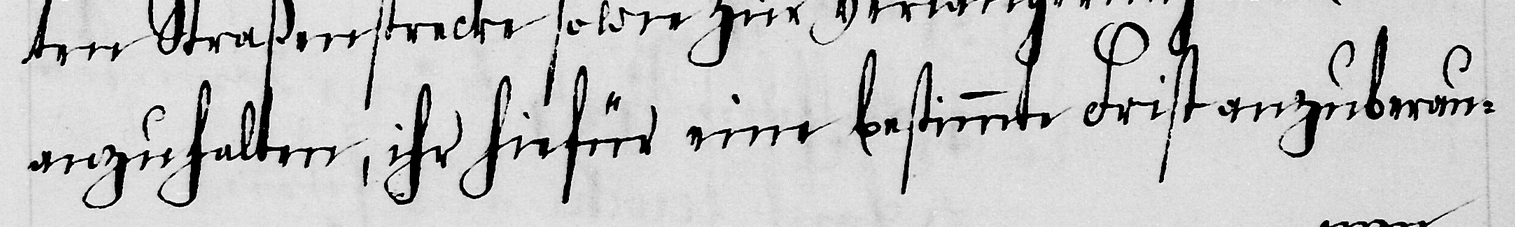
anzuhalten, ihr hiefür eine bestimmte Frist anzuberau-
